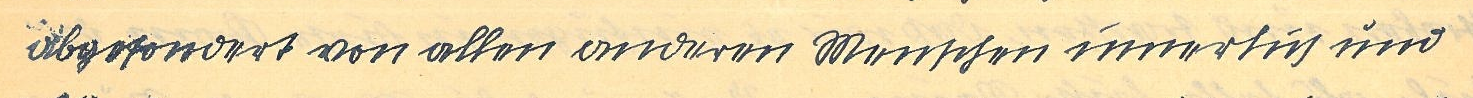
abgesondert von allen anderen Menschen innerlich und
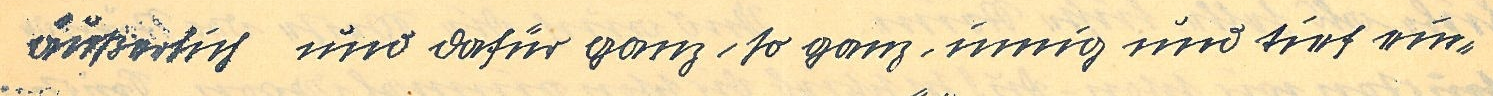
äußerlich und dafür ganz, so ganz, innig und tief ein¬
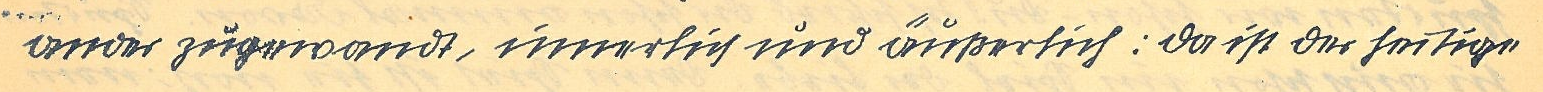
ander zugewandt, innerlich und äußerlich: Da ist der heilige
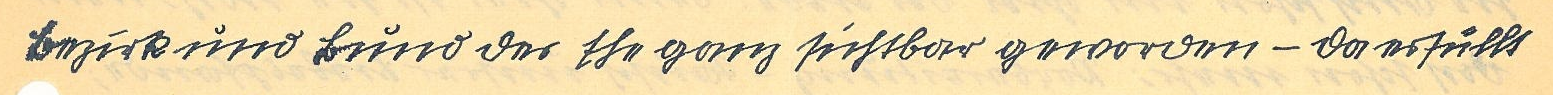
Bezirk und Bund der Ehe ganz sichtbar geworden – da erfüllt
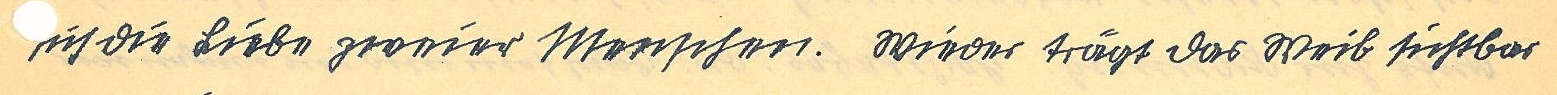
ich die Liebe zweier Menschen. Wieder trägt das Weib sichtbar
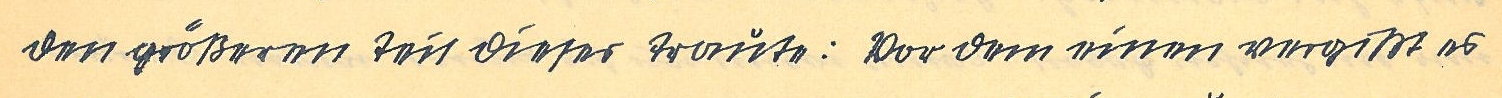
den größeren Teil dieser Traute: Vor dem einen vergißt es
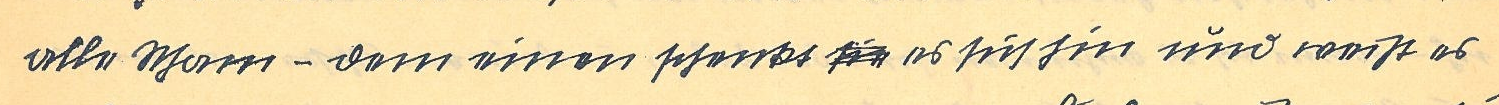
alle Scham – dem einen schenkt sie es sich hin und weiht es
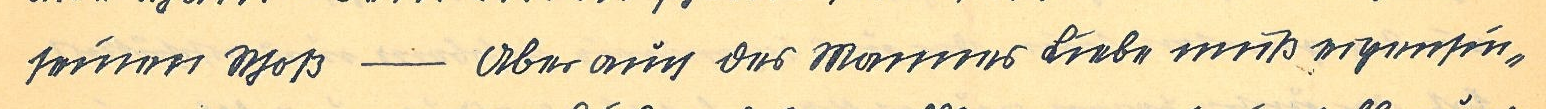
seinen Schoß — Aber auch des Mannes Liebe muß eigensin¬
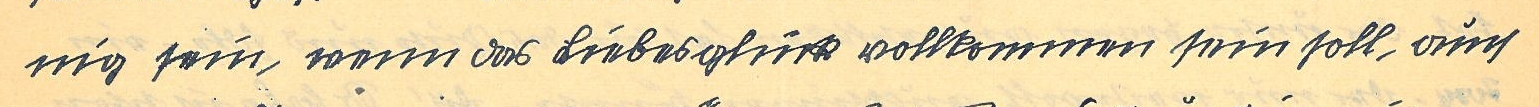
nig sein, wenn das Liebesglück vollkommen sein soll, auch
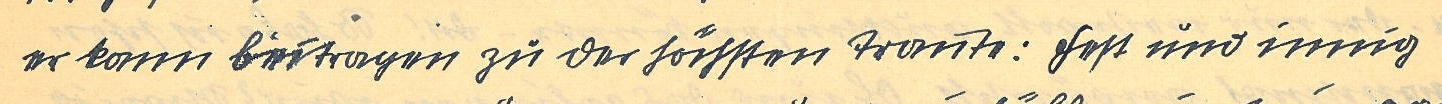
er kann beitragen zu der höchsten Traute: fest und innig
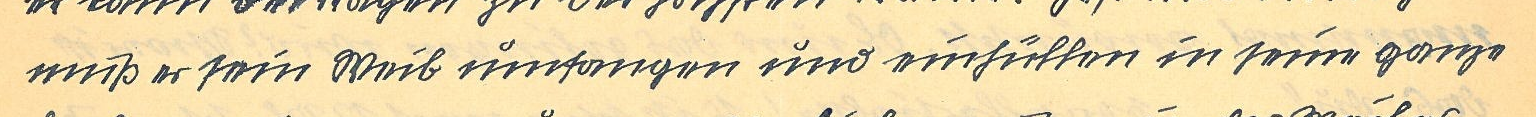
muß er sein Weib umfangen und einhüllen in seine ganze
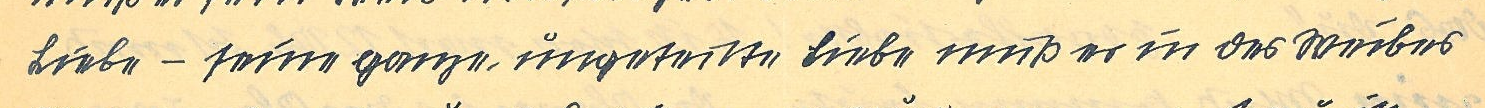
Liebe – seine ganze, ungeteilte Liebe muß er in des Weibes
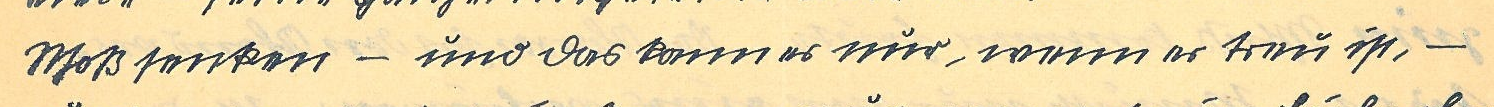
Schoß senken – und das kann er nur, wenn er treu ist, –
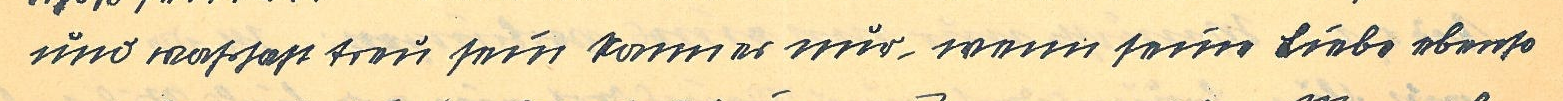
und wahrhaft treu sein kann er nur, wenn seine Liebe ebenso
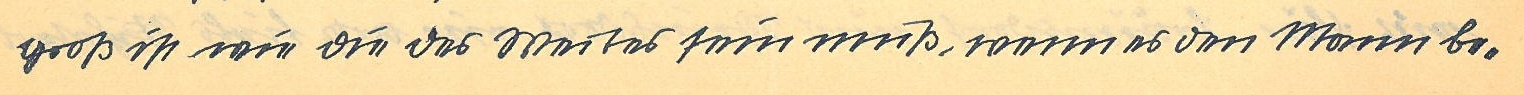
groß ist wie die des Weibes sein muß, wenn es den Mann be¬
